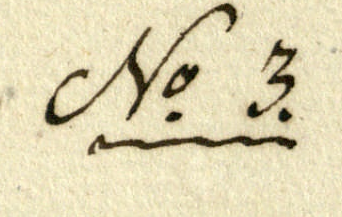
Nº 3.
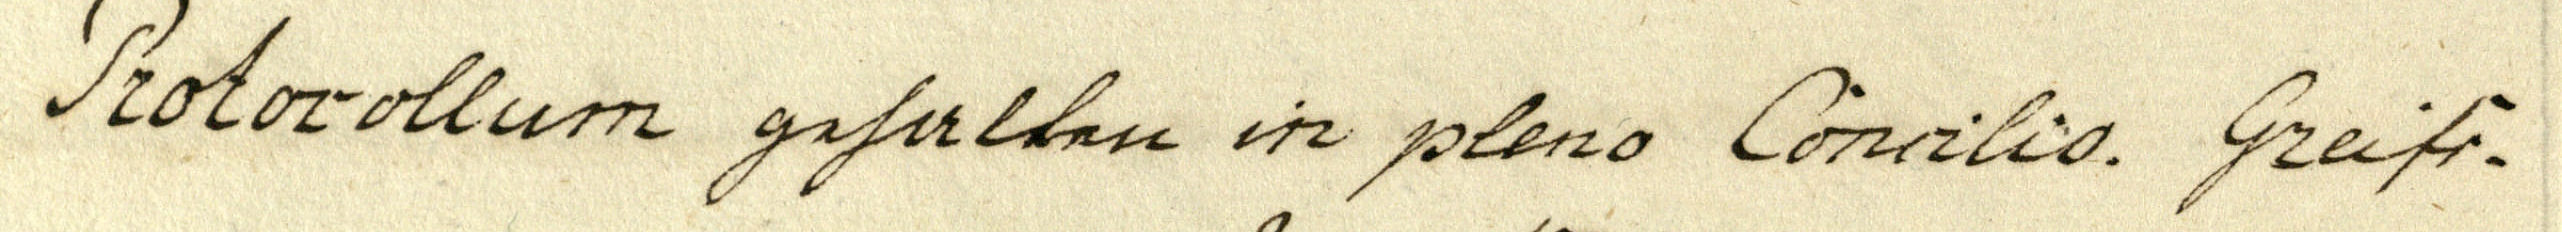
Protocollum gehalten in pleno Concilio. Greifs¬
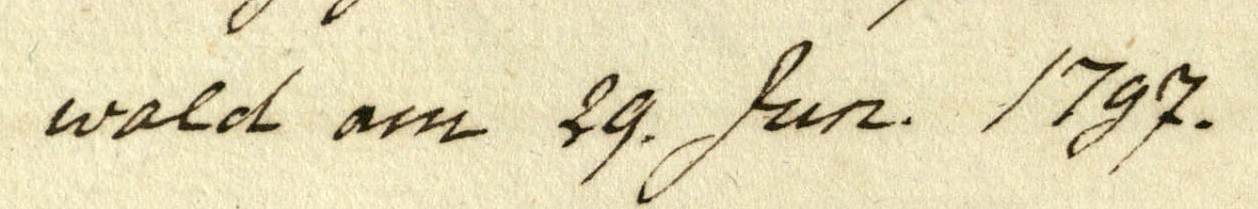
wald am 29. Jun. 1797.
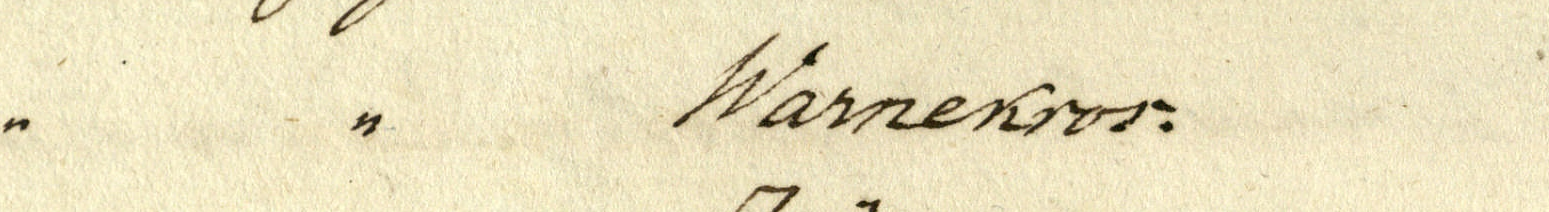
Warnekros.
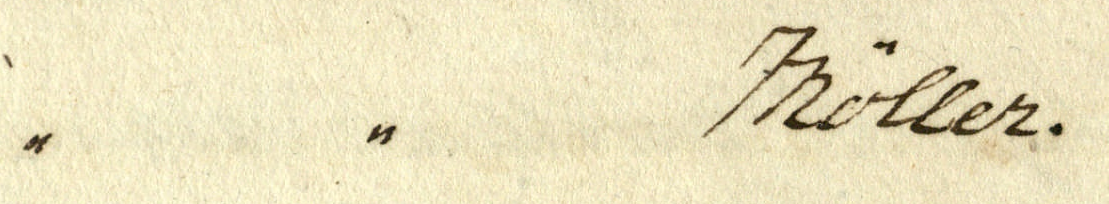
Möller.
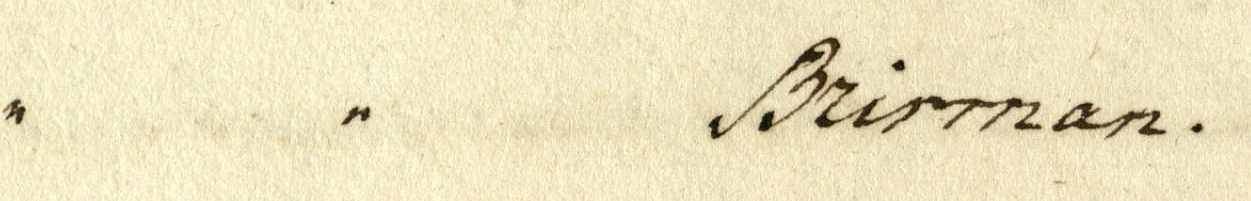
Brisman.
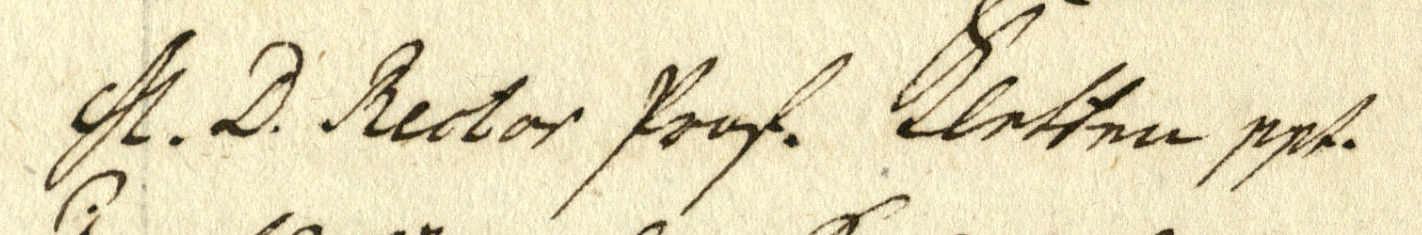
M. D. Rector Prof. Kletten ppt.
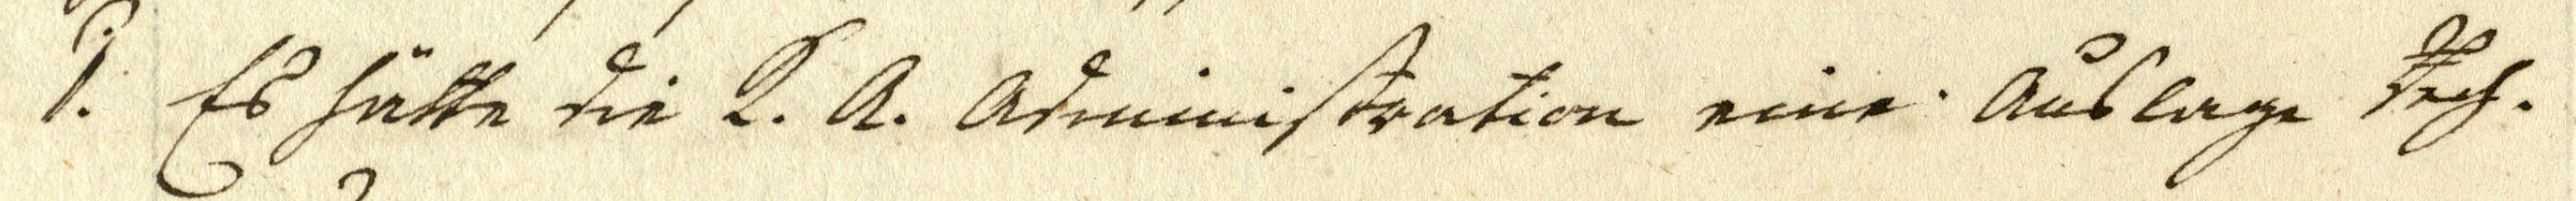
1. Es hätte die K. A. Administration eine Auslage Rech¬
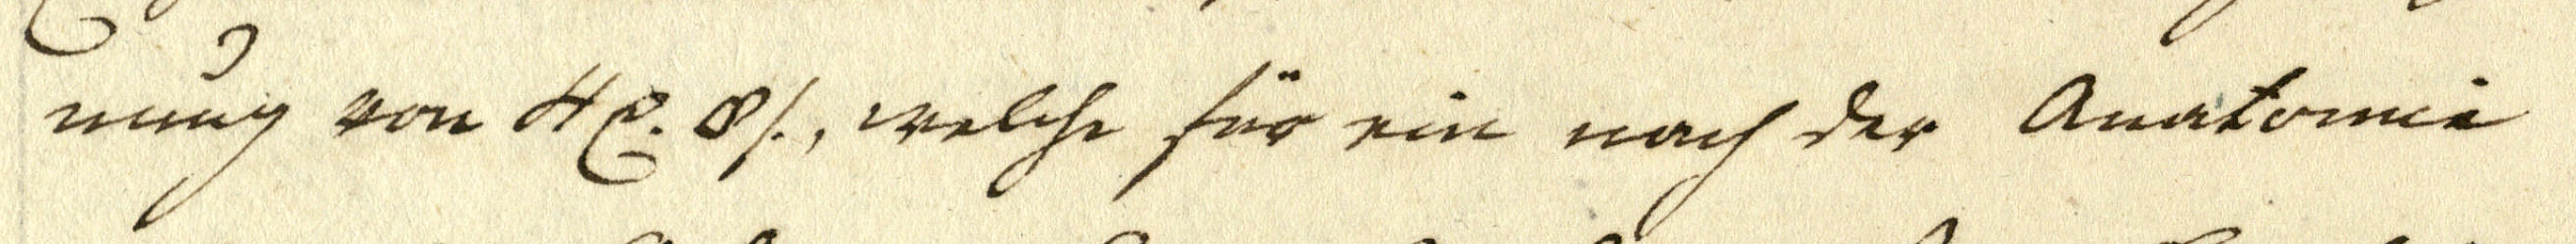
nung von 4 l. 8s. welche für ein nach der Anatomie
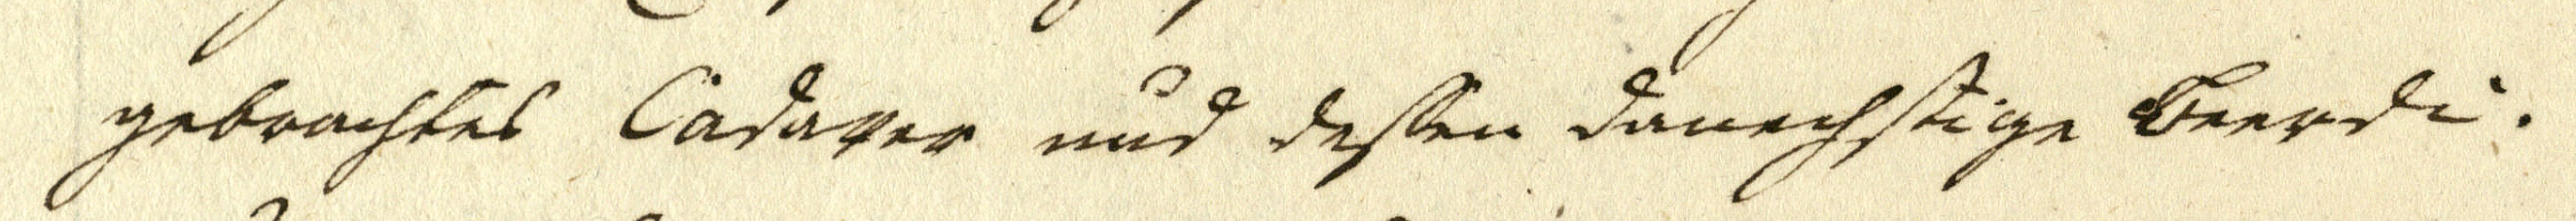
gerbrachtes cadaver und dessen danechstige Beerdi¬
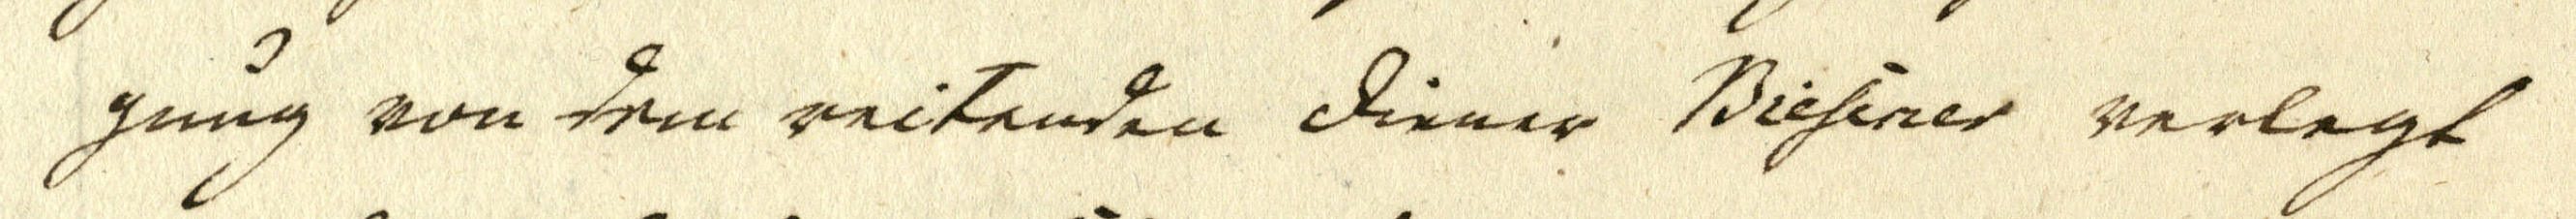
gung von dem reitenden Diener Biesener verlegt
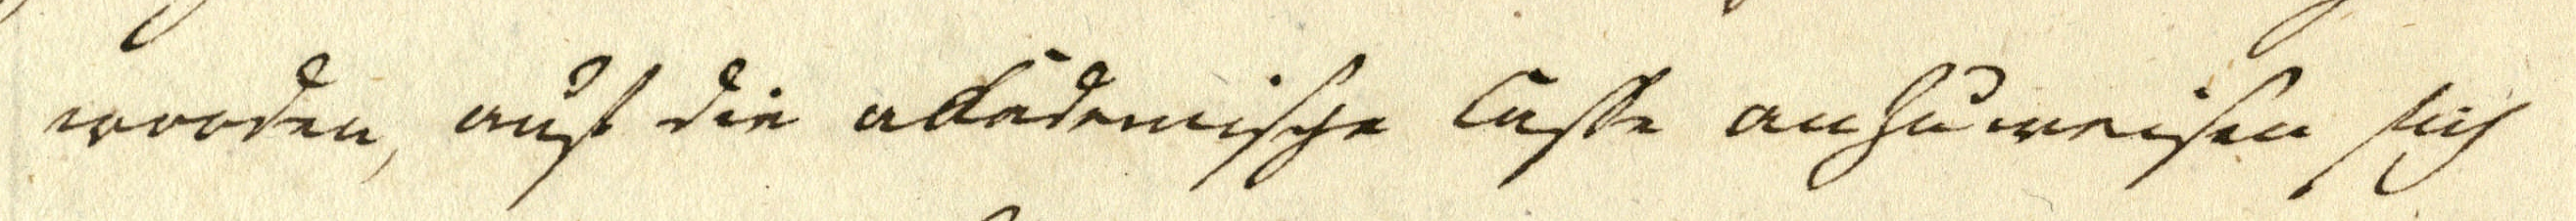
worden, auf die akademsiche Casse anzuweisen sich
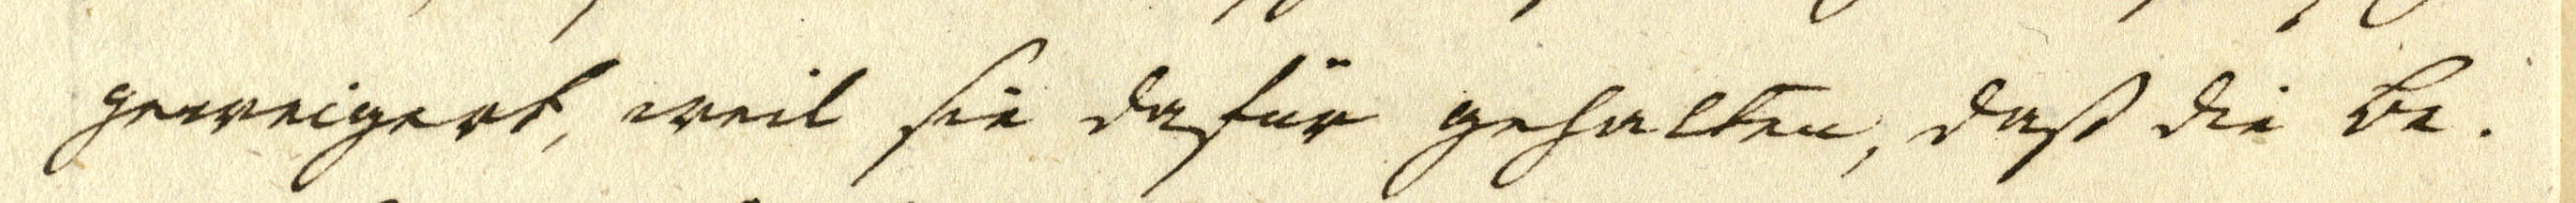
geweigert, weil sie dafür gehalten, daß die Be¬
